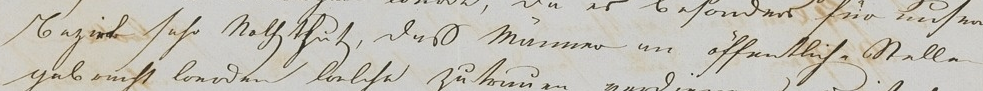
Bezirk sehr Noth thut, daß Männer an öffentliche Stellen
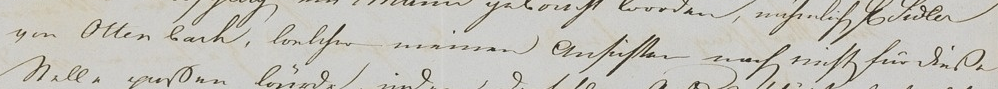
von Ottenbach, welcher meinen Ansichten nach, nicht für dieße
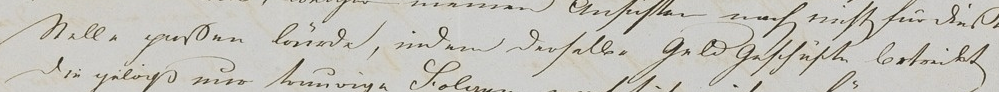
Stelle paßen würde, indem derselbe Geld Geschäfte betreibt
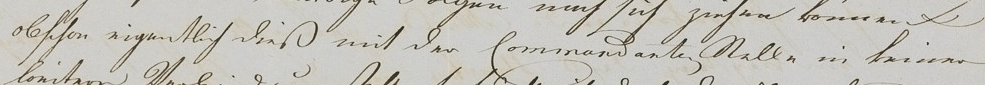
obschon eigentlich dieß mit der Commandanten Stelle in keiner
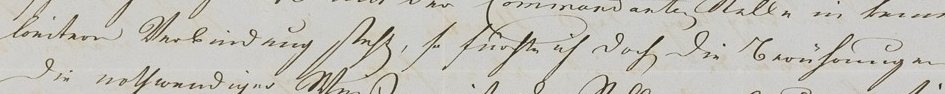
weitern Verbindung steht, so fürchte ich doch, die Berührungen
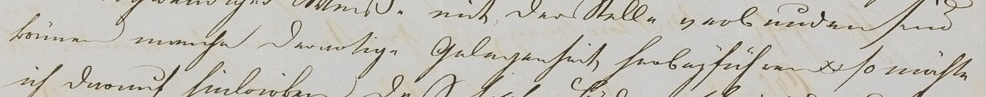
können manche derartige Gelegenheit herbeyführen, u so möchte
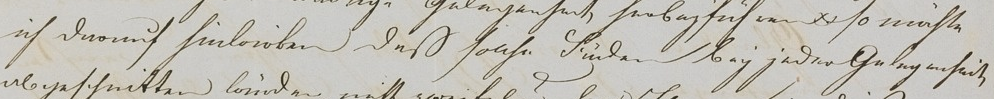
ich darauf hinwirken daß solche Fäden bey jeder Gelegenheit
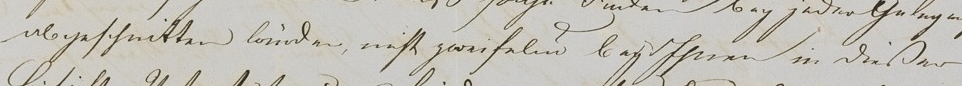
abgeschnitten würden, nicht zweifelnd bey Ihnen in dießer
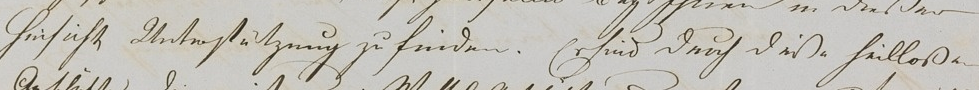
Hinsicht Unterstützung zu finden. Es sind durch dieße heilloßen
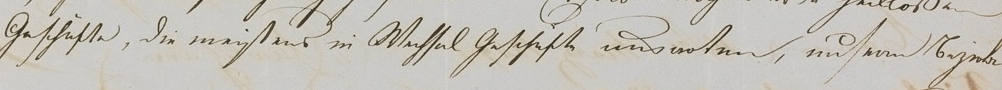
Geschäfte, die meistens in Wechsel Geschäfte ausarten, unserm Bezirke
